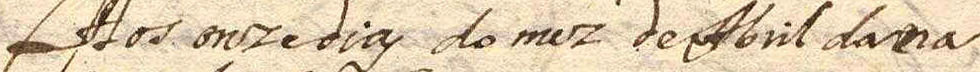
Aos onze dias do mez de Abril dana
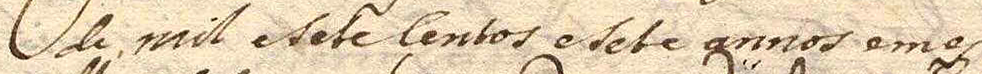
de mil e seteCentos e sete annos em es
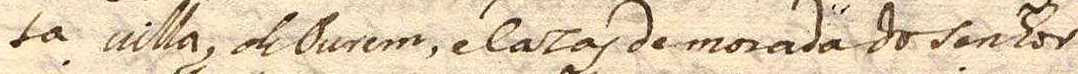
ta uilla, de Ourem, e Cazas de morada do senhor
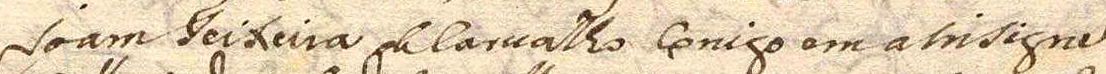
Joam Teixeira de Carualho conigo em a insigne
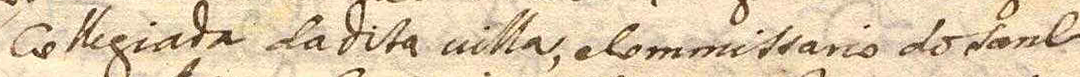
Collegiada da dita uilla, e Commissario do sanC
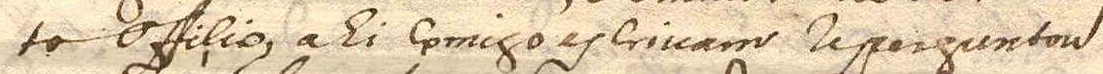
to Officio, ahi Comigo escriuam Reperguntou
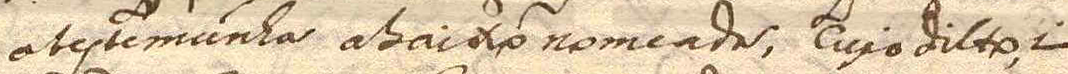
a testemunha abaixo nomeada, Cujo dicto, i
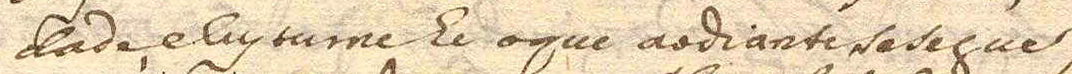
dade, e Custume he o que aodiante se segue
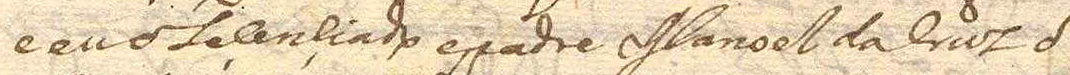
e eu o Lecenciado e padre Manoel da Cruz o
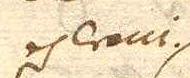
escreui.
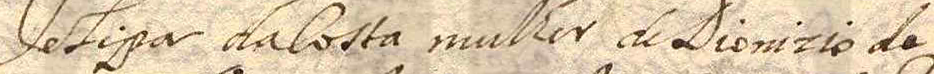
Felipa da Costa mulher de Dionizio de
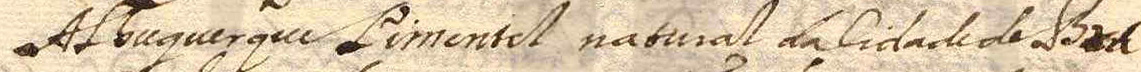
Albuquerque Pimentel natural da Cidade de Bra
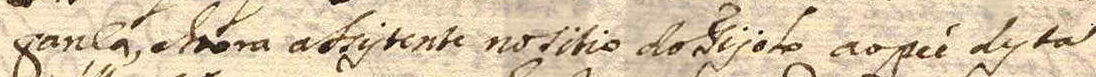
gança, e hora assistente no sitio do Tijolo ao peé desta
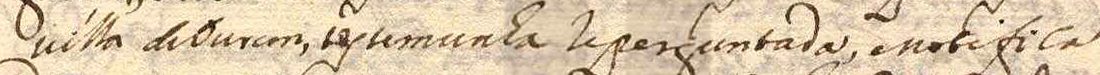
uilla de Ourem, testemunha Reperguntada, e notifica
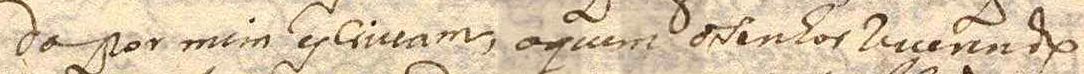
do por mim escriuam, a quem o senhor Reuerendo
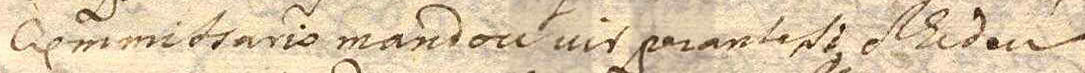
Commissario mandou uir perante si, e lhe deu
